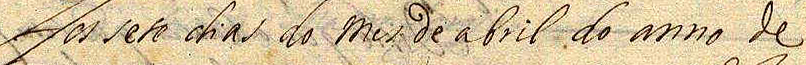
Aos sete dias do mes de abril do anno de
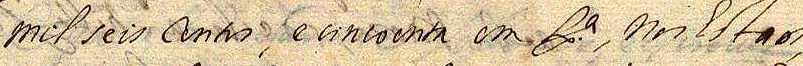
mil seiscentos, e cincoenta em Lx.a, nos Estaos,
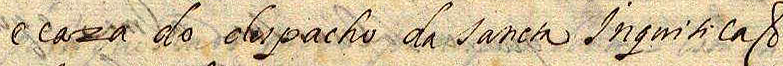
e caza do despacho da sancta Inquisicaõ,
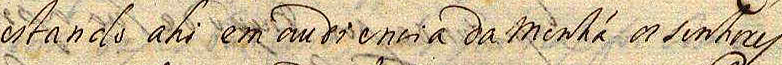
estando ahi em audiencia da menhã os senhores
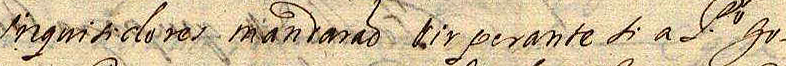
inquisidores mandaraõ vir perante si a P.o go
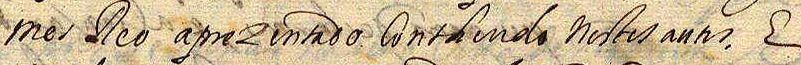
mes Reo aprezentado contheudo nestes autos. E
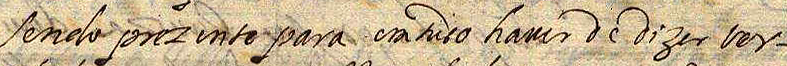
sendo prezente para em tudo hauer de dizer ver
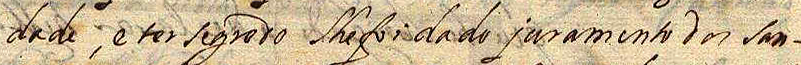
dade, e ter segredo lhe foi dado juramento dos san
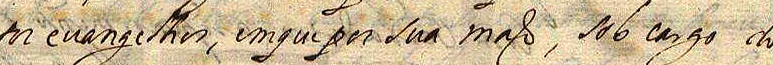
tos euangelhos, em que pos sua maõ, sob cargo do
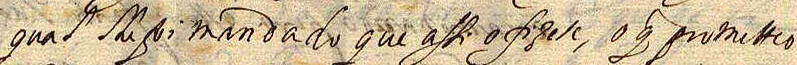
qual lhe foi mandado que assi o fizese, o q̄ prometteo
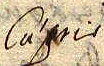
cūprir.
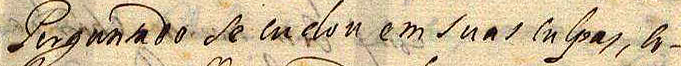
Perguntado se cudou em suas culpas, co
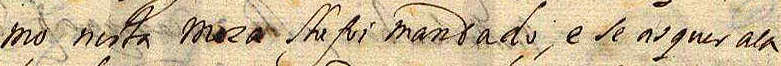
mo nesta meza lhe foi mandado, e se as quer aca
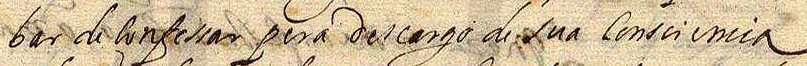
bar de confessar pera descargo de sua consciencia,
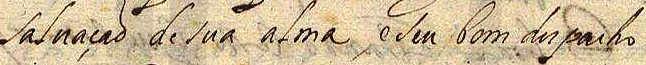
saluação de sua alma, e seu bom despacho.
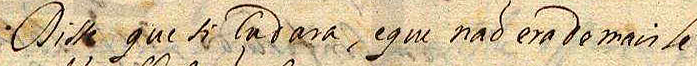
Disse que si cudara, e que naõ era do mais lē
